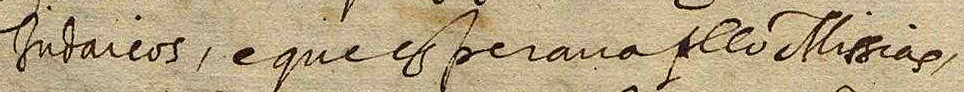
Judaicos, e que esperaua pllo Missias,
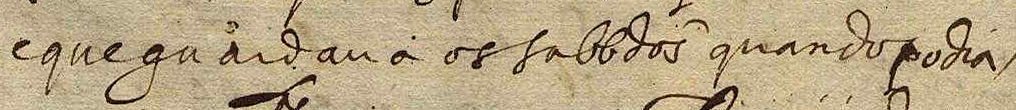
e que guardaua os sabbdos̄ quando podia,
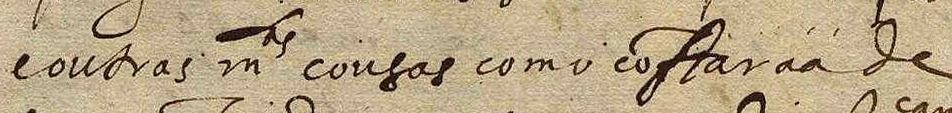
e outras mtas cousas como cōstaraa de
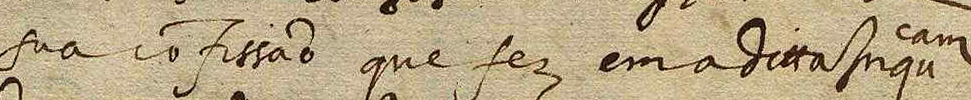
sua cōfissão que fez em a ditta Jnqucam
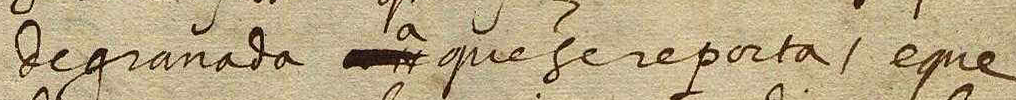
de granada a que se reporta / e que
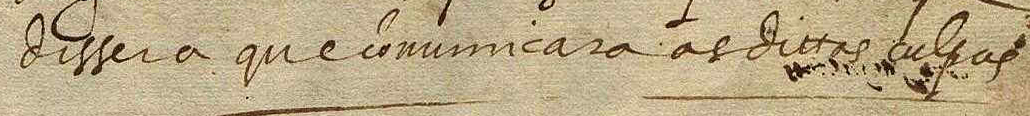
dissera que cōmunicara as dittas culpas
